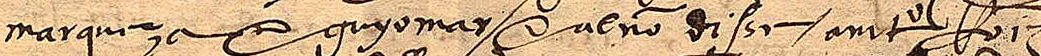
marqueza e guyomar / e al n̄o disse / amto Roīz
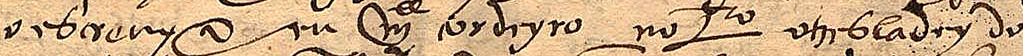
o escreuy e eu mell cordeyro notro o tresladey do
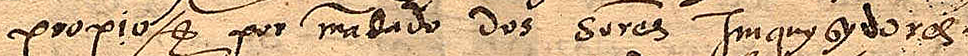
propio / por mādado dos Sōres Jmquysydores
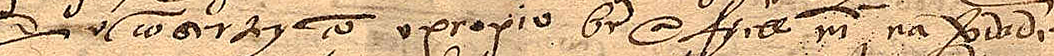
e o c̄osertey c̄o o propio bē e fyellmte na ꝟdade
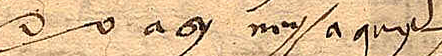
e o asyney / aquy
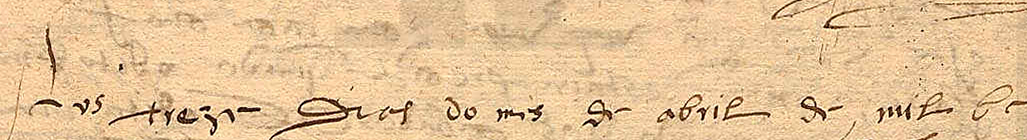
Aos treze dias do mes de abril de mil bc
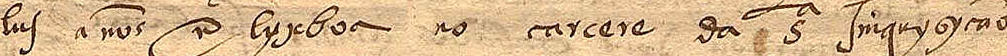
liij an̄os ē lyxboa no carcere da sta Jmquysycão
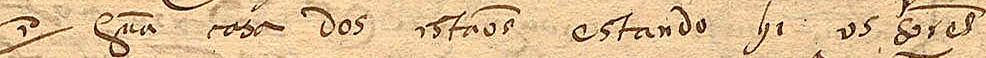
ē hūa casa dos estaos estando hi os Sōres
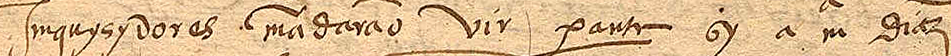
Jmquysydores m̄andarão vir ꝑante sy a ma diaz
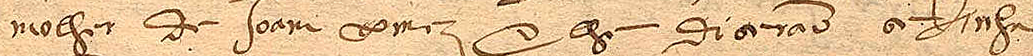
molher de Joam gomez e lhe diserão se tinha
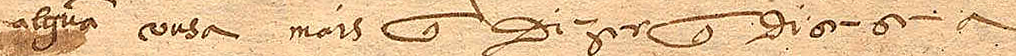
algūa cousa mais q̄ dizer q̄ disese a
